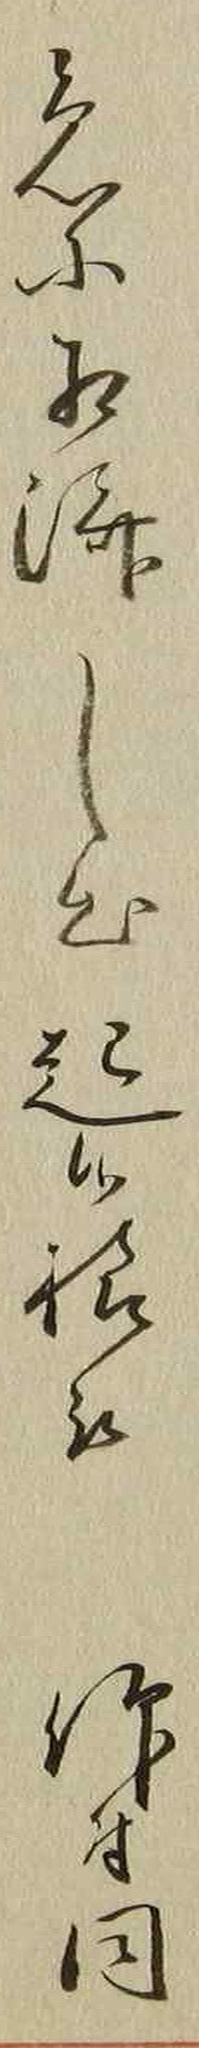急に相済し出起候様被仰付同
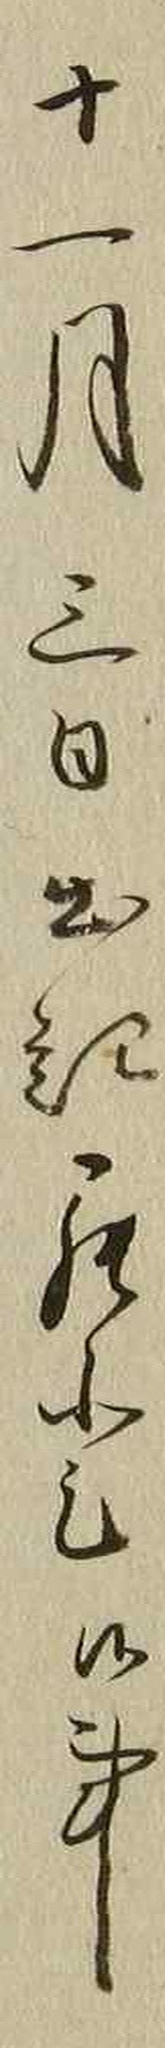十一月三日出起罷登候事
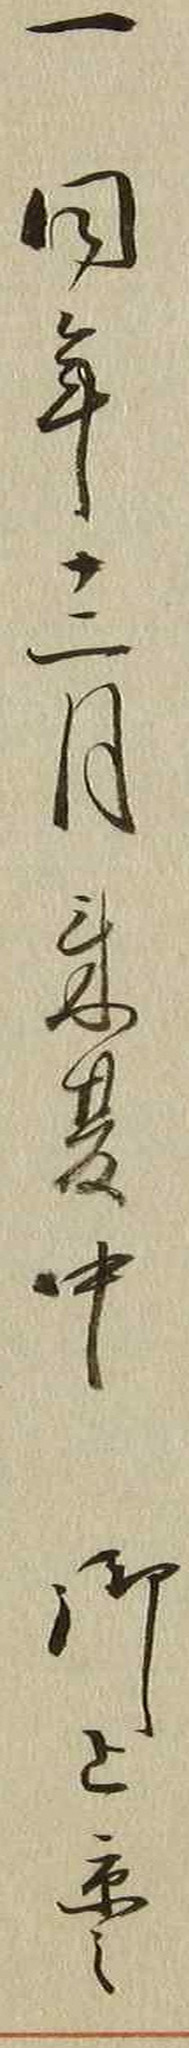一同年十二月来夏中御上京之
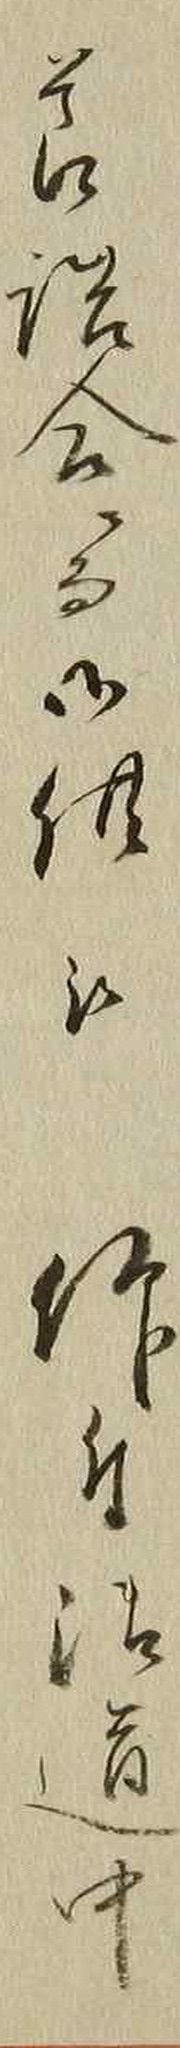節詰合ニ而御供被仰付御道中
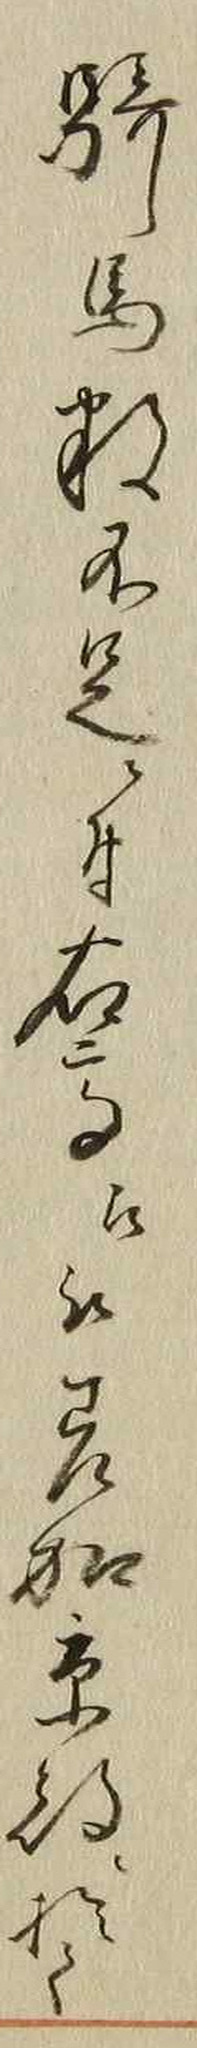騎馬数不足ニ付右馬江被差加京都ニ於て
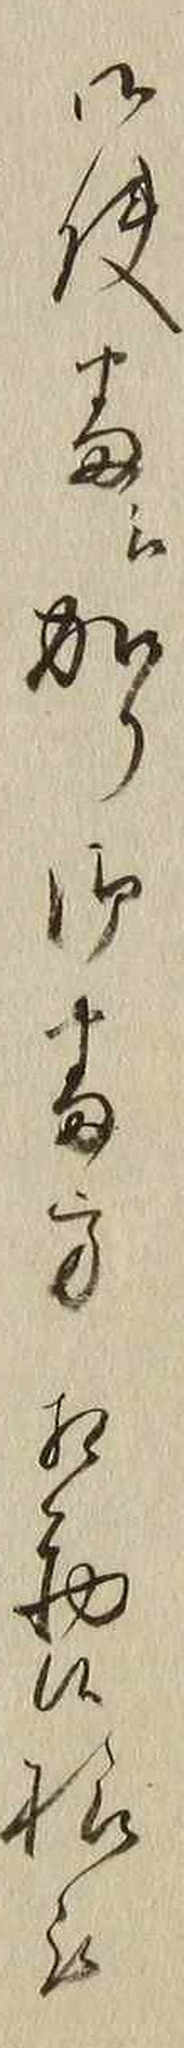御使番江加り御番方相勤候様被
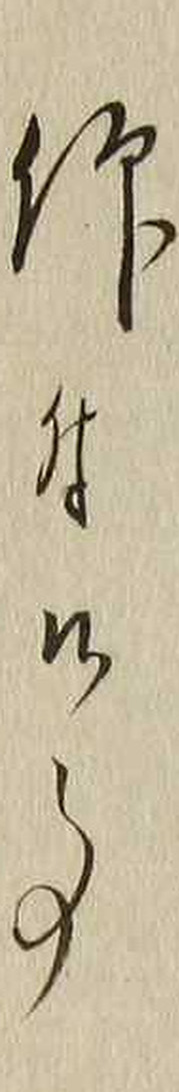仰付候事
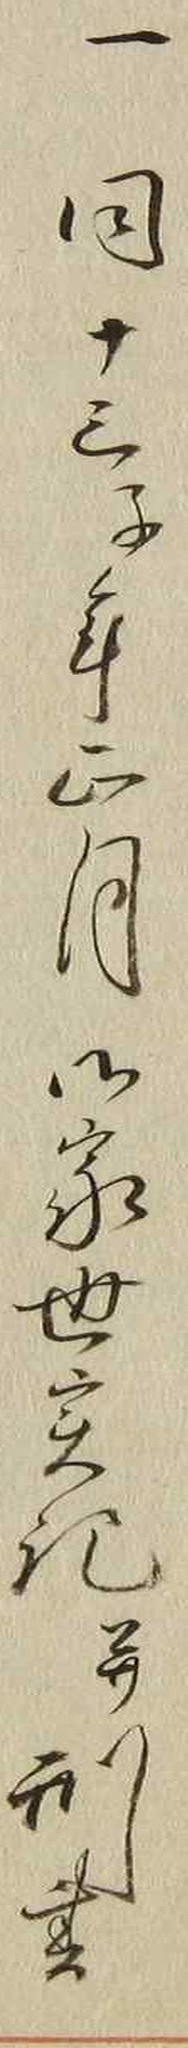一同十三子年正月御家世実記幷刑書
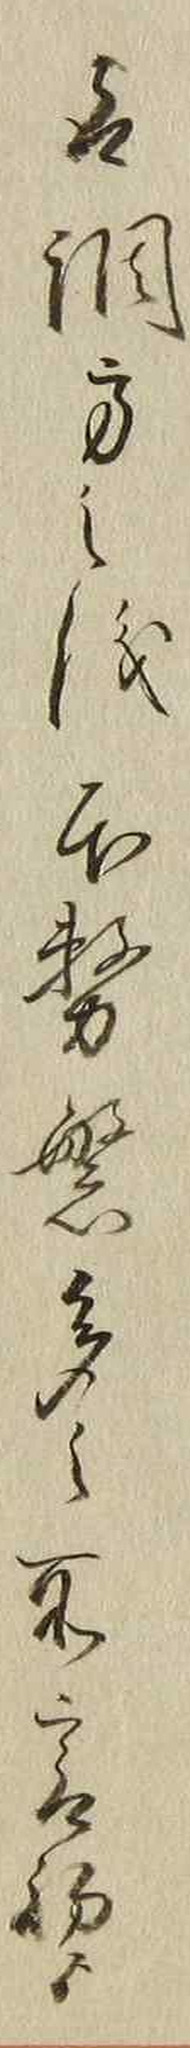取調方之儀本務繫多之所最初ゟ
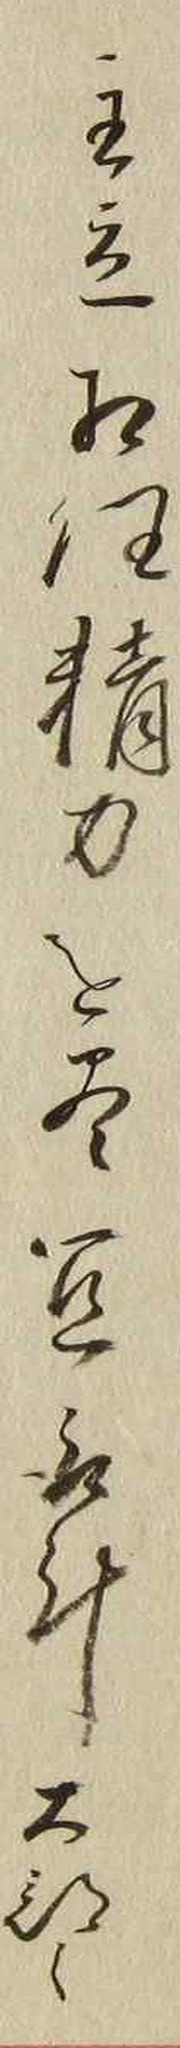主立相任精力を尽宜取計大部之
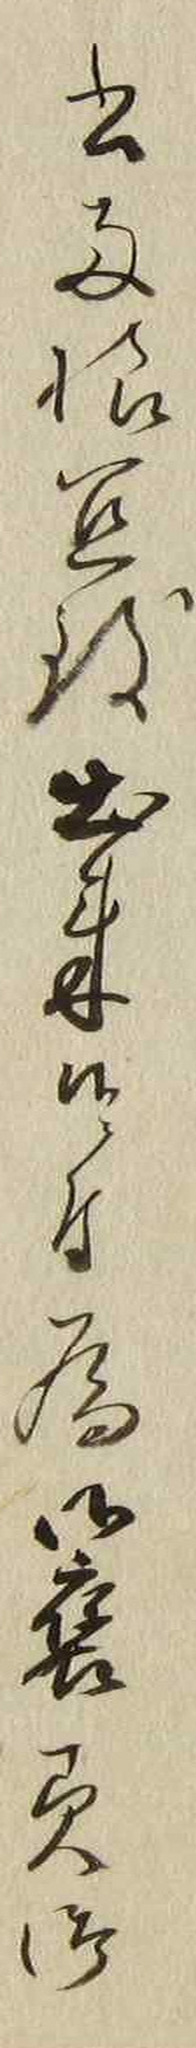書両様宜致出来候ニ付為御褒美御
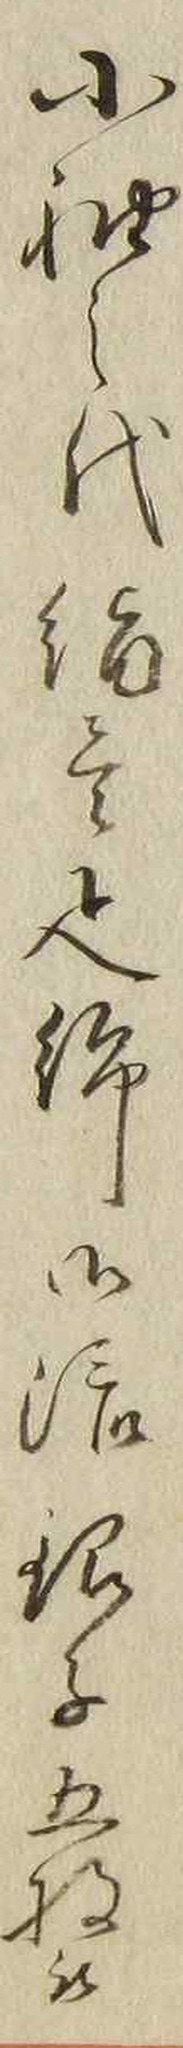小袖之代絹壱疋綿御流銀子五枚被
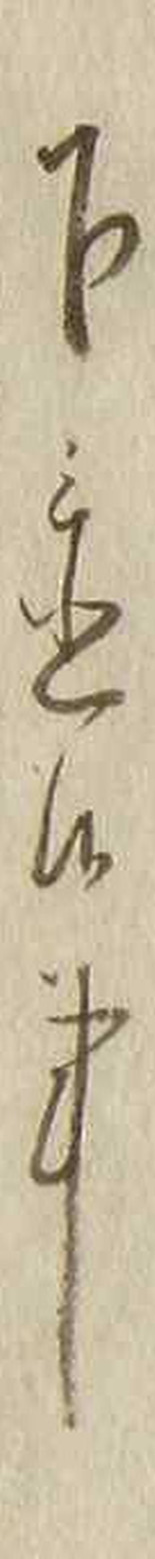下置候事
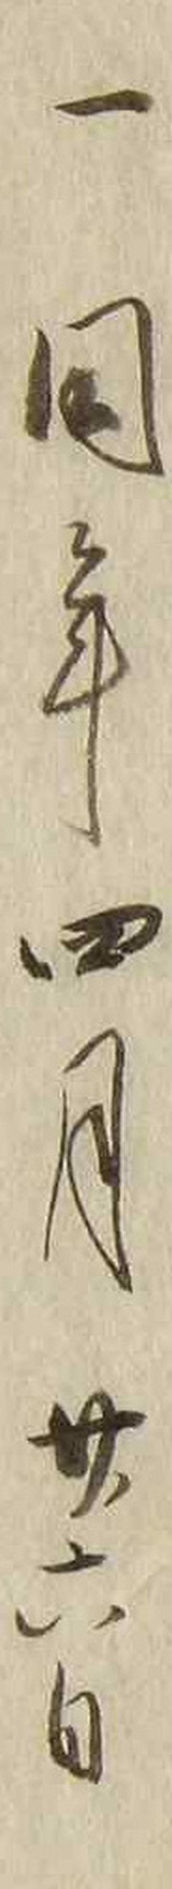一同年四月廿六日

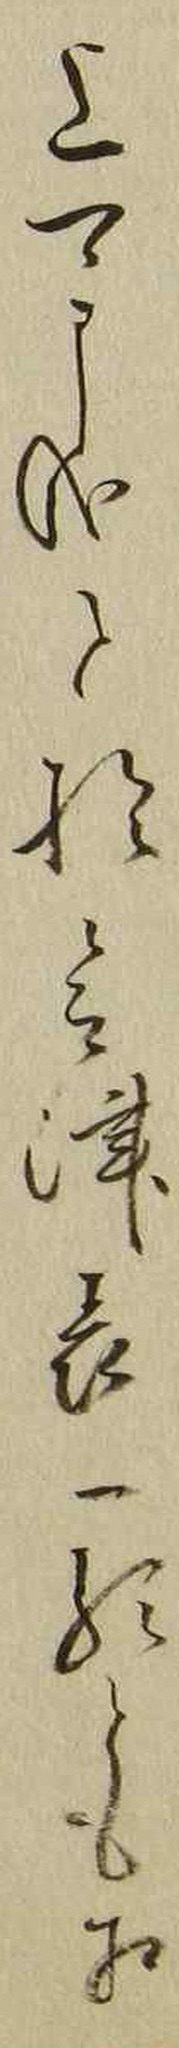上可申哉と於会津表一類とも相
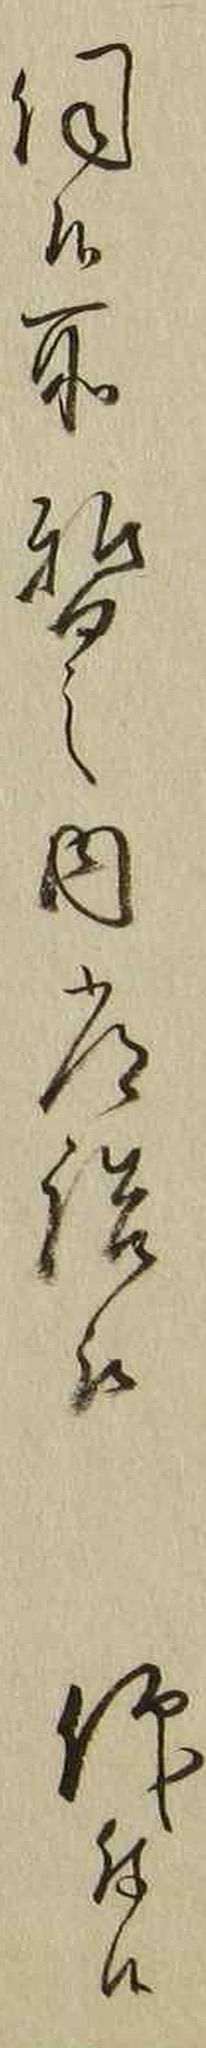伺候所暫之内常詰被仰付候
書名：諸士系譜　巻之68　を之部2
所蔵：会津若松市立会津図書館
